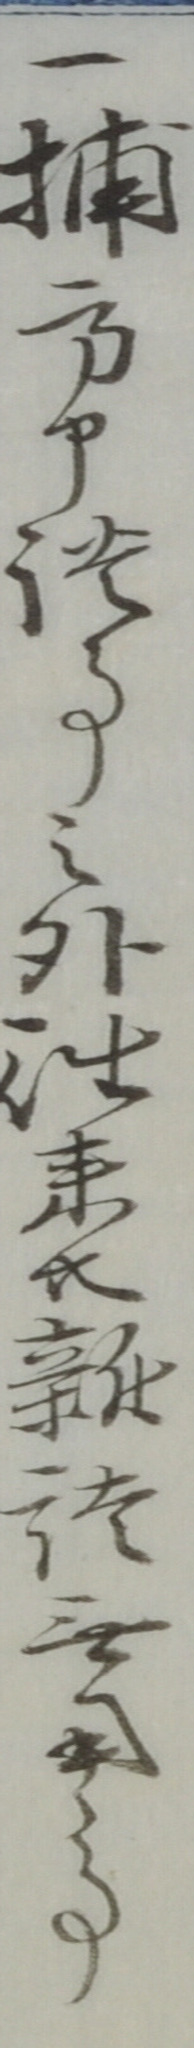一捕方申談事之外往来共雑談無用之事
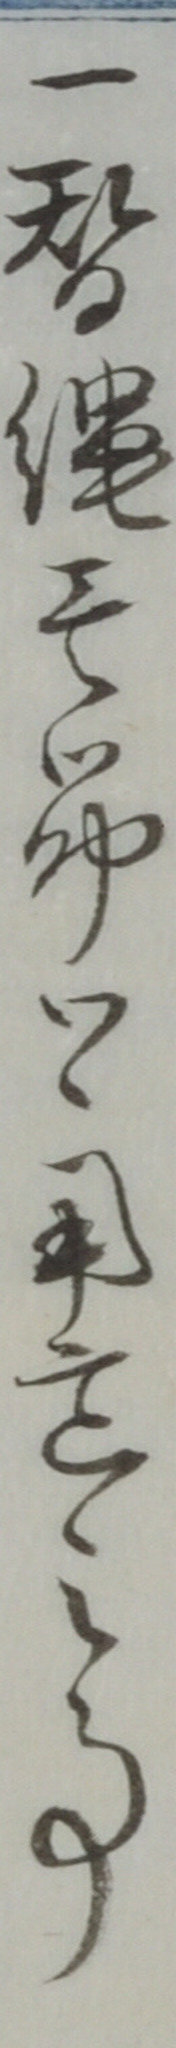一替縄壱筋ツヽ用意之事
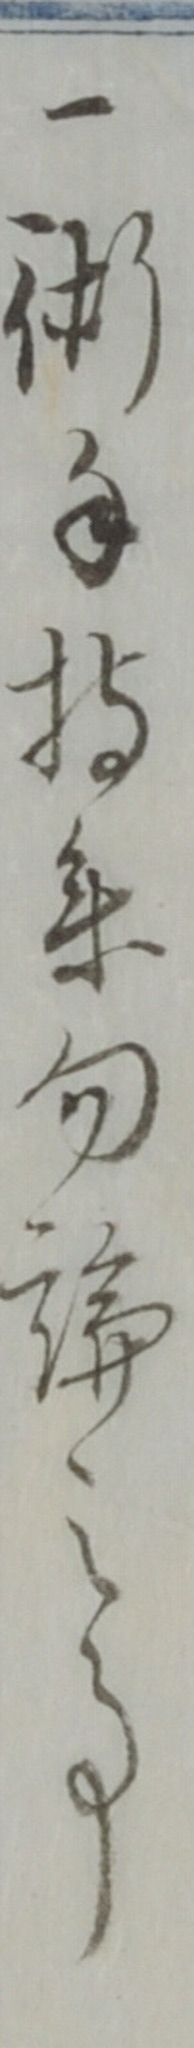一術手持参勿論之事
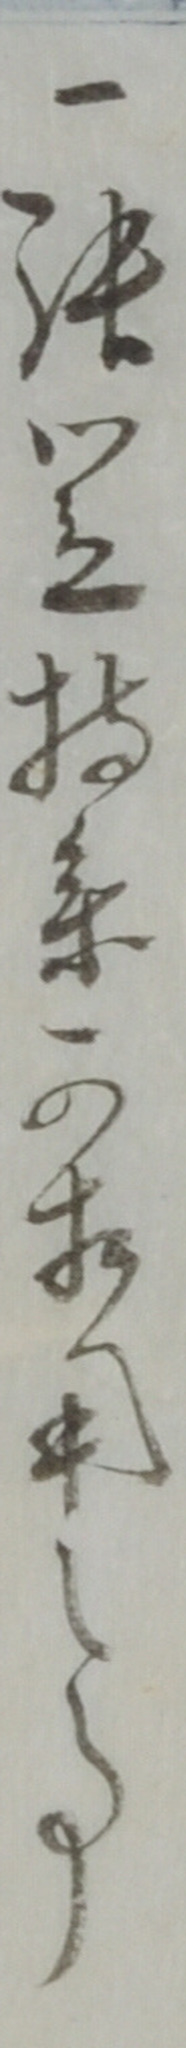一張笠持参可相用之事
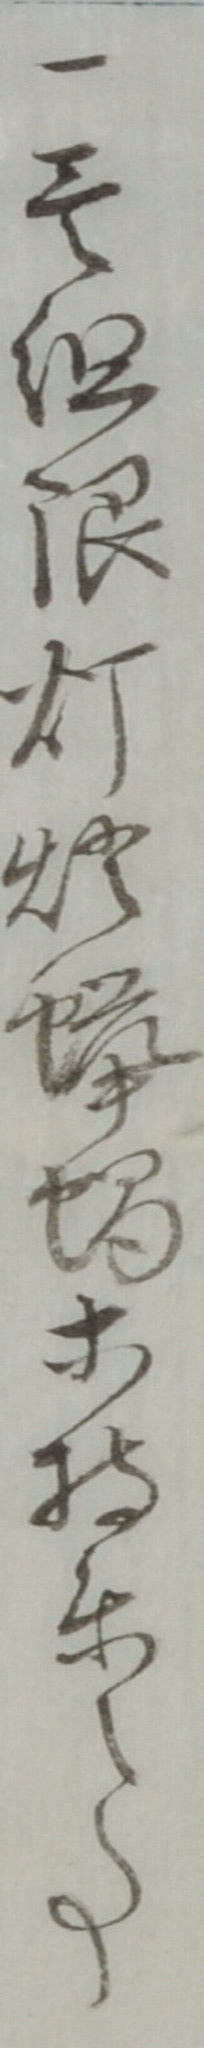一壱組限灯燈蝋燭等持参之事
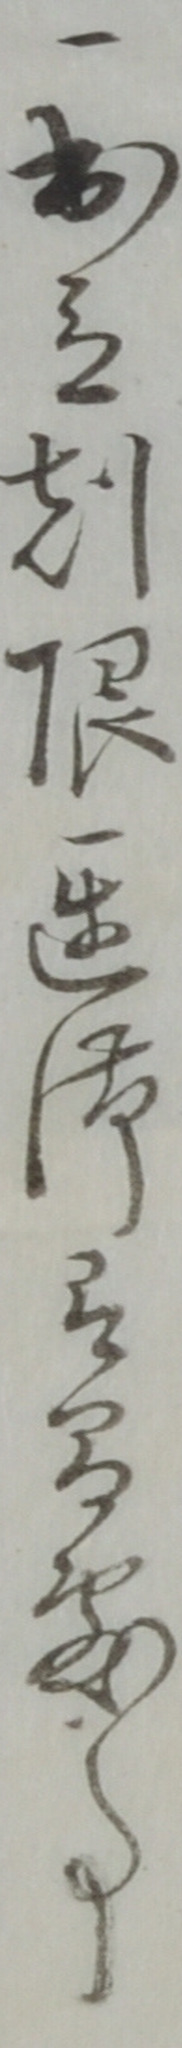一出立刻限遅滞有間敷事
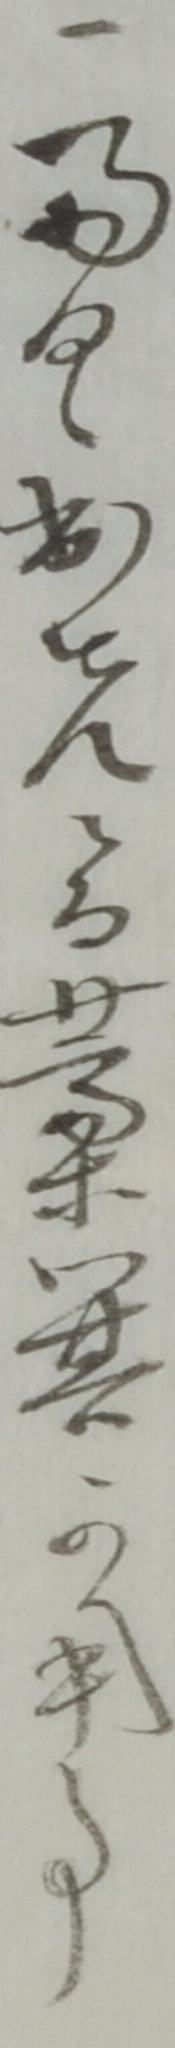一雨具出先ニ而藁箕可用事
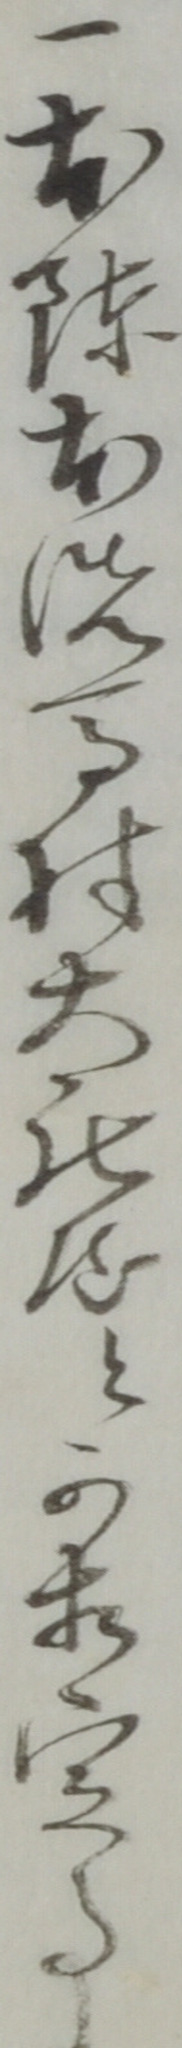一本陣本洗馬村大庄屋と可相定事
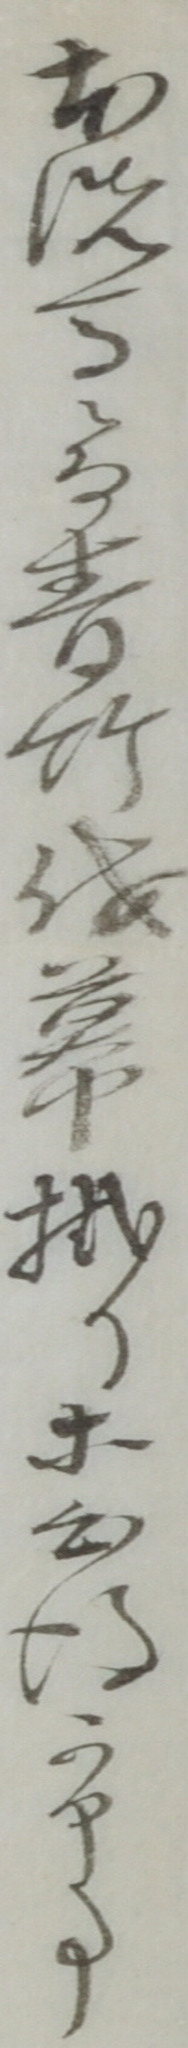本洗馬ニ而青竹伐幕掛り等心得可申事

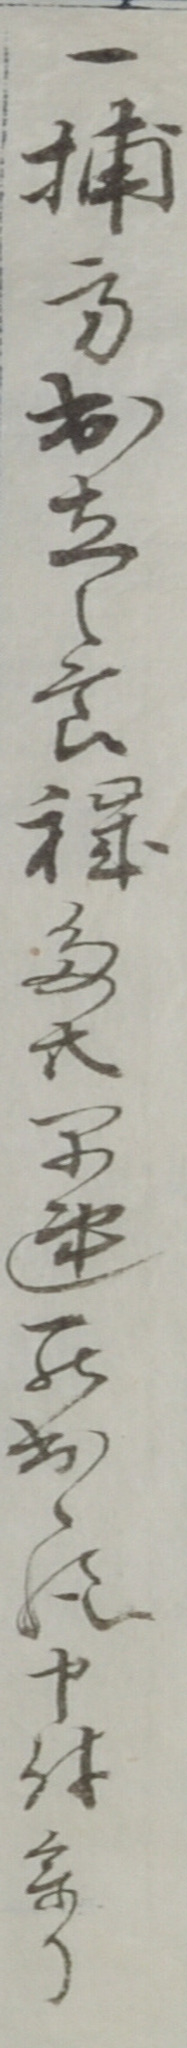一捕方出立之節穢多共早速罷出候様申付参り
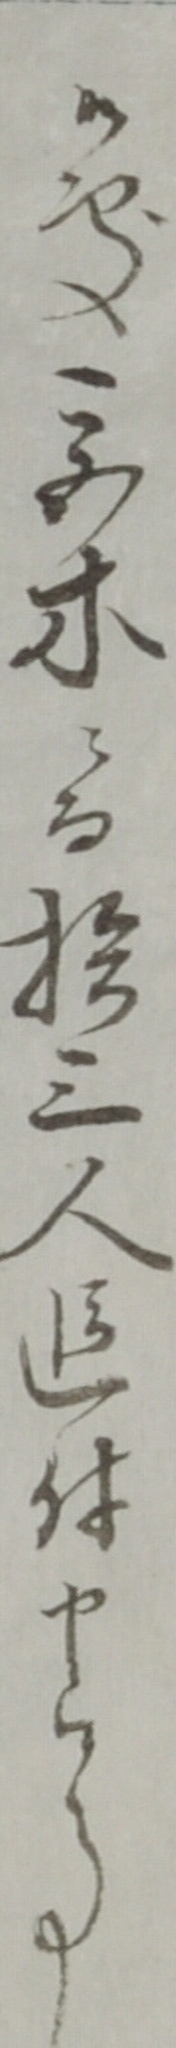候処宮木に而拾三人追付申候事
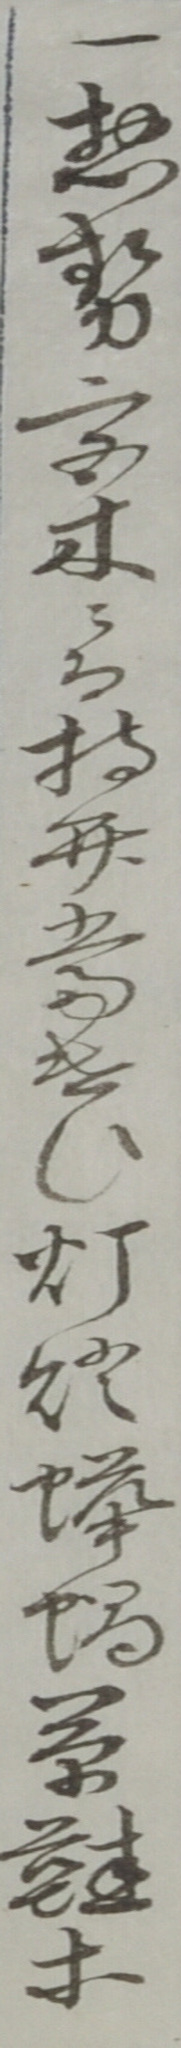一惣勢宮木に而持弁当遣ひ行灯蠟燭草鞋等
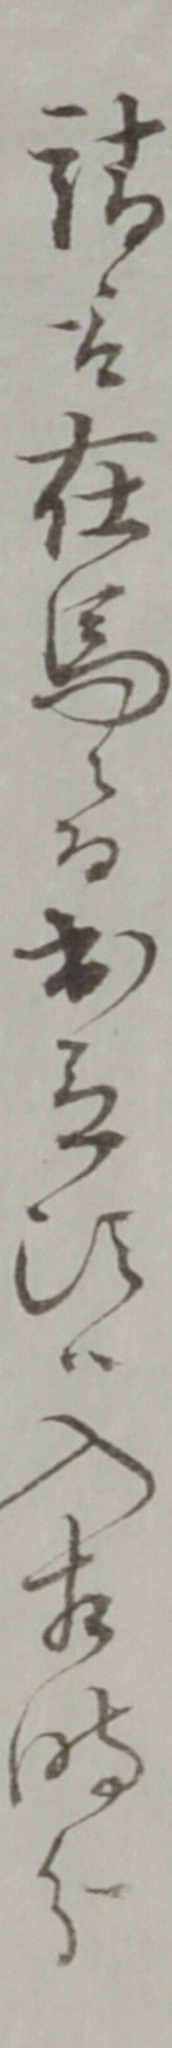請取在馬に而出立頃は入相時分
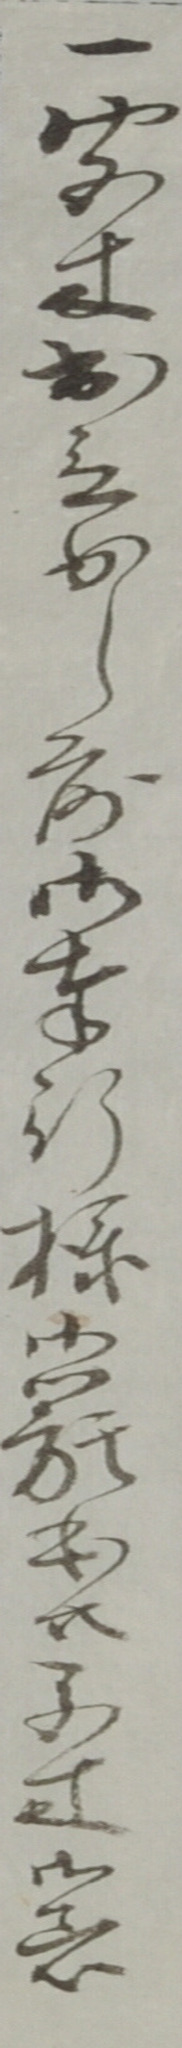一宮木出立少し前御奉行様御籏本共宮木御着
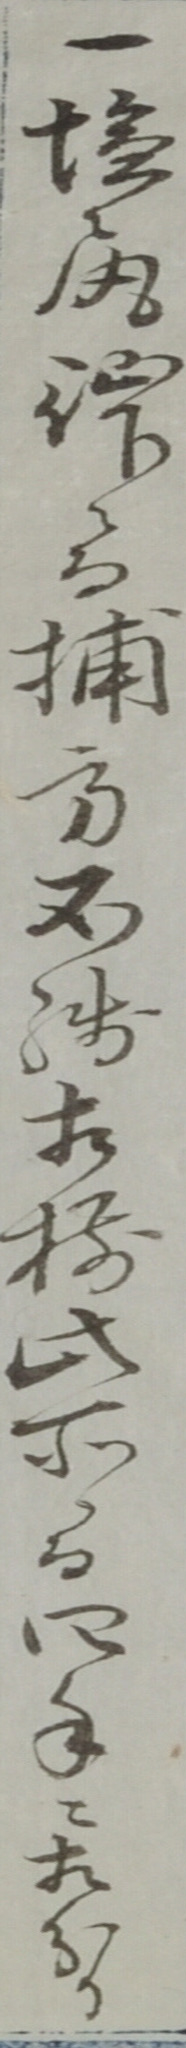一塩尻峠に而捕方不残相揃此所に而四手に相分り
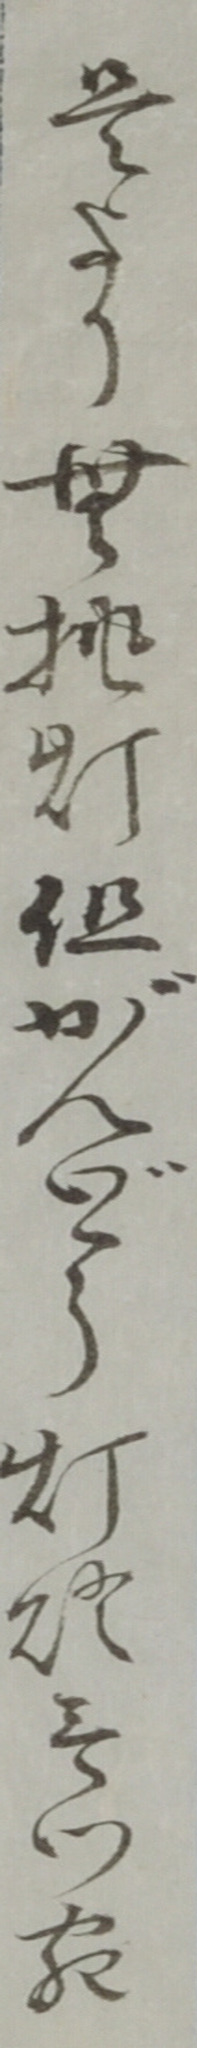是より無挑灯但がんどう灯燈壱つ宛
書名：高遠領洗馬騒動一件抜書
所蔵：伊那市立高遠町図書館・合同会社AMANE
